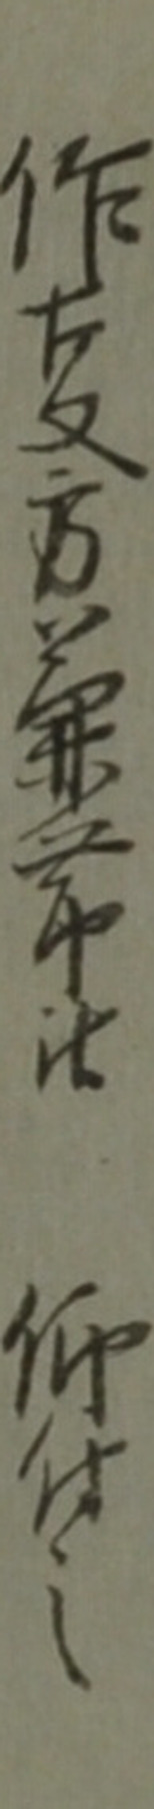作事方兼帯被仰付之
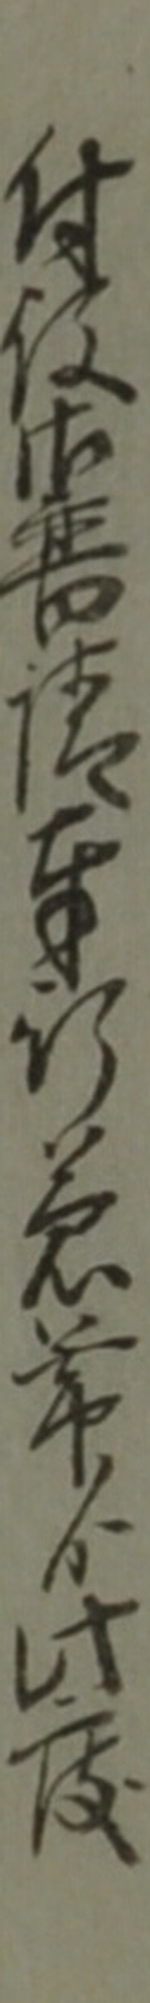付役御普請奉行兼帯ゟ此度
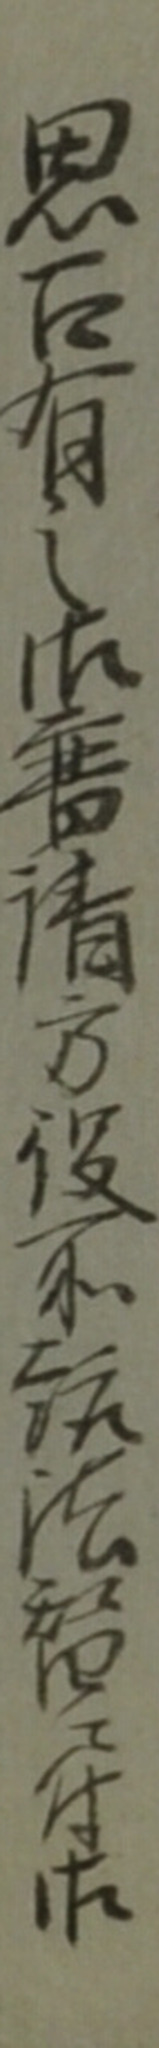思召有之御普請方役所趣法替ニ付御
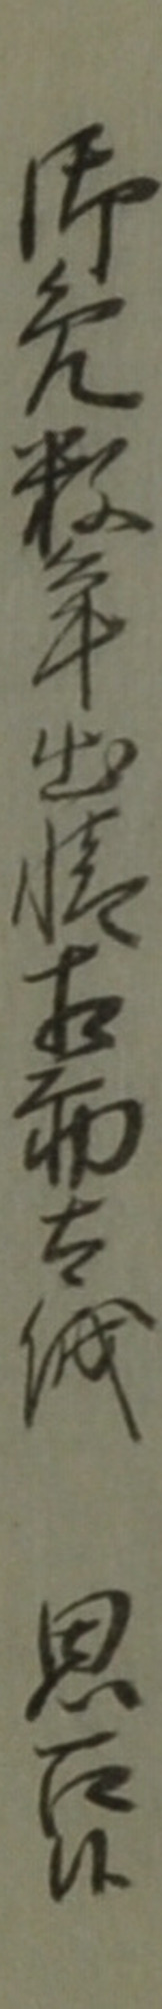御免数年出精相勤左儀思召候
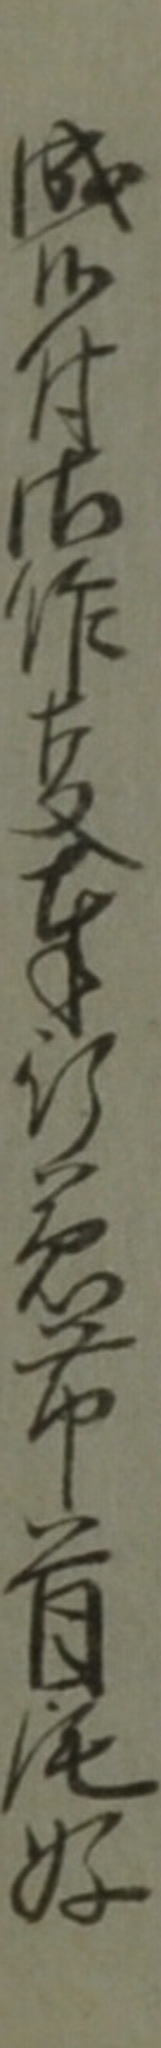成候付御作事奉行兼帯首尾好
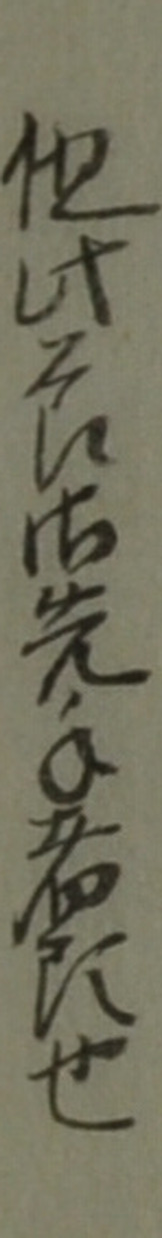但此節御先手者頭也
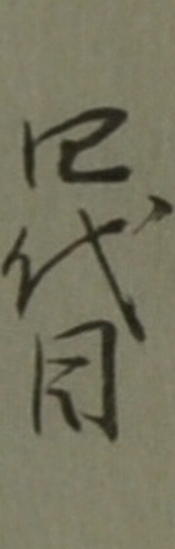四代目
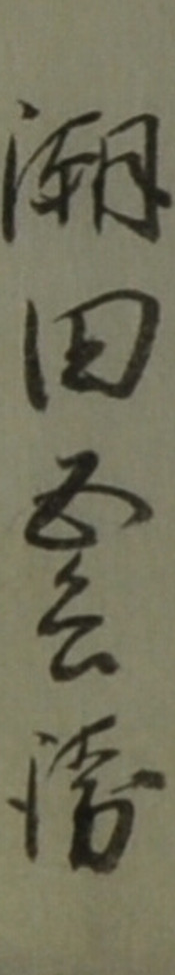瀬田五兵衛
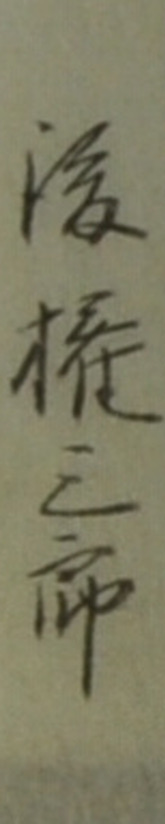後権三郎

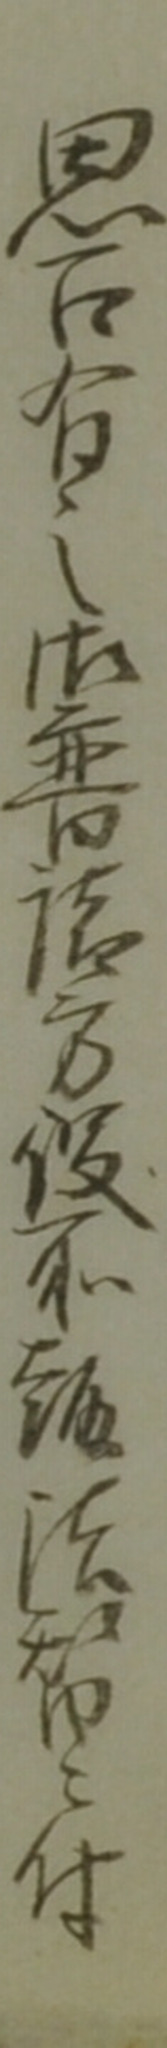思召有之御普請方役所趣法替ニ付
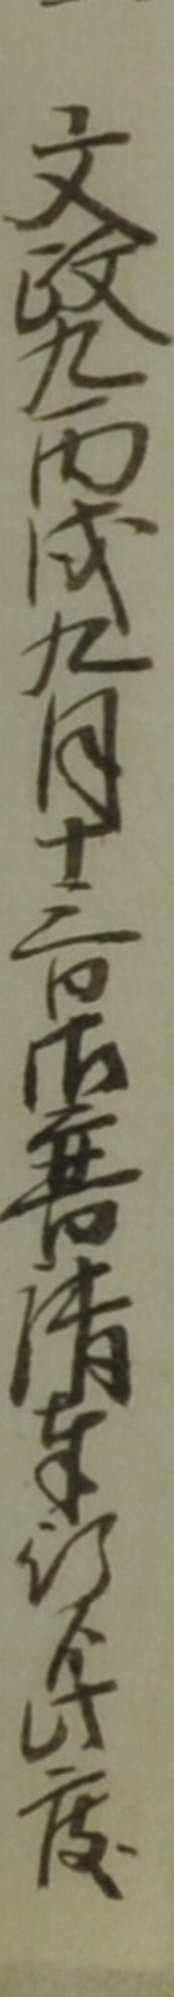一文政九丙戌九月十三日御普請奉行ゟ此度
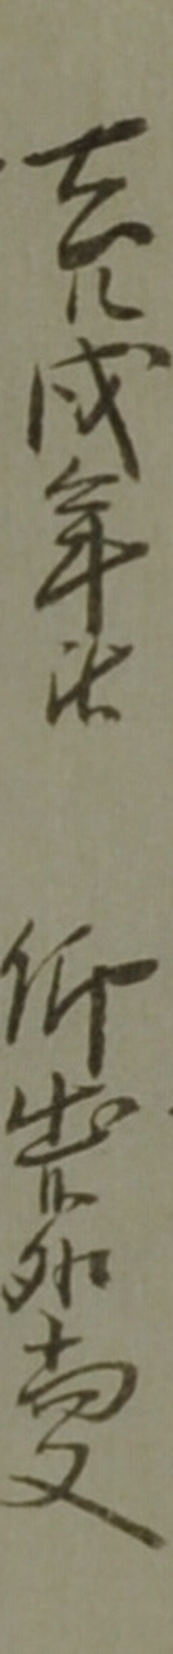去ル戌年被仰出候処尚又
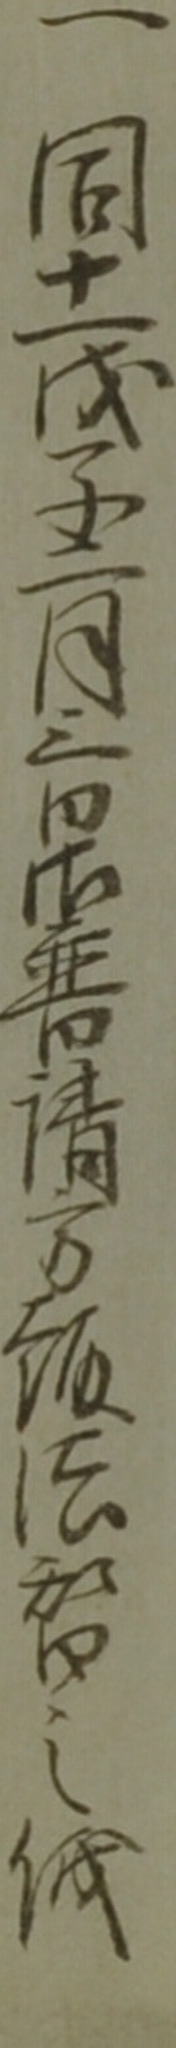一同十一戊子二月三日御普請方趣法替之儀
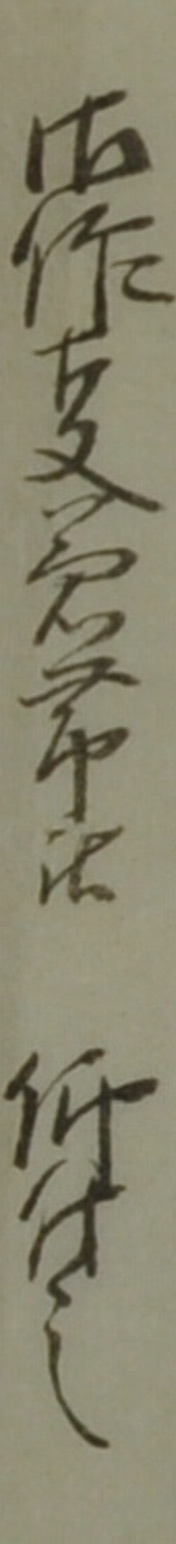御作事兼帯被仰付之
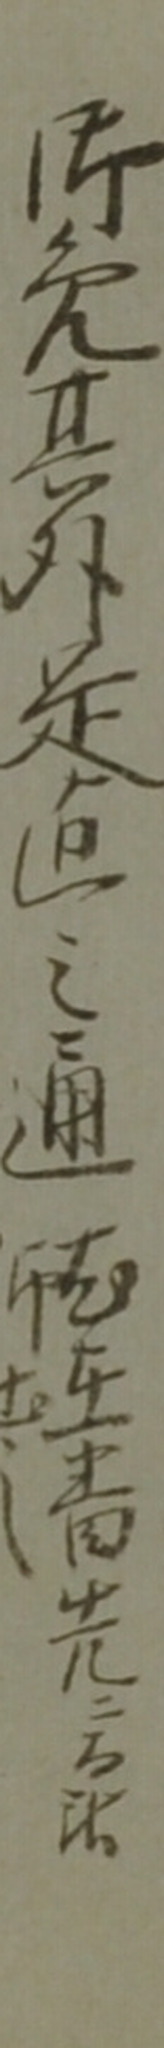御免其外是迄之通尤在番先ニ而被
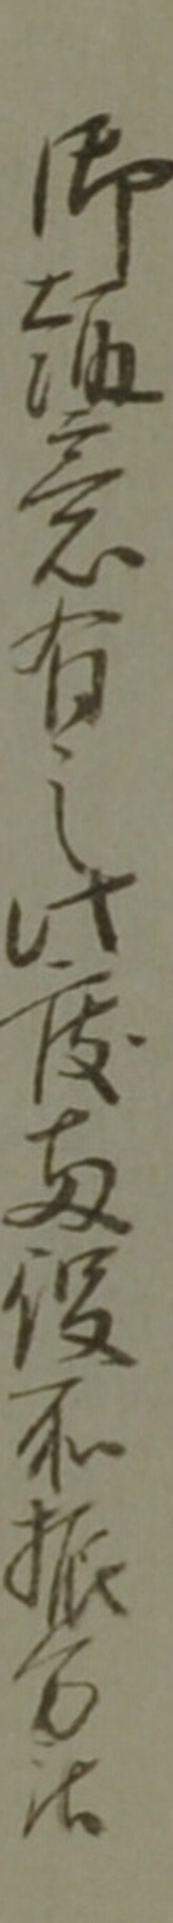御趣意有之此度両役所振分被
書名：諸御役代々録（六）
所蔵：伊那市立高遠町図書館・合同会社AMANE
